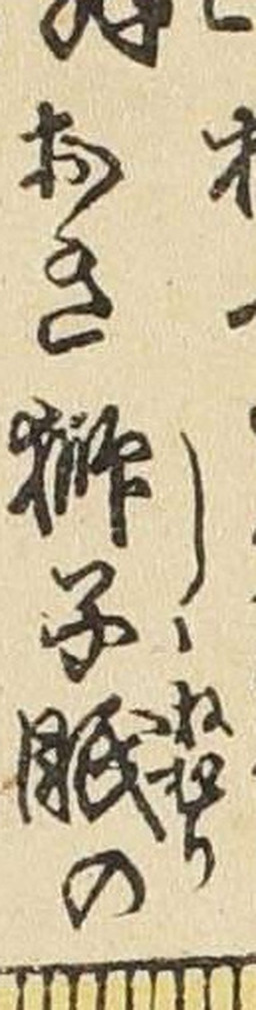おき獅子眠の
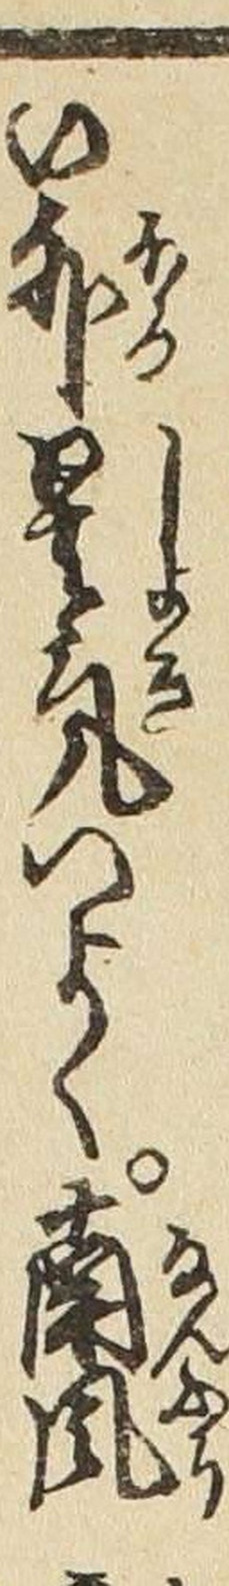の外暑気つよく。南風
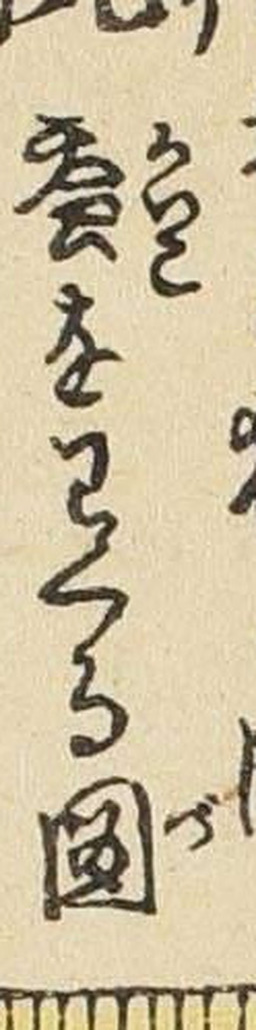蚕をわくる図
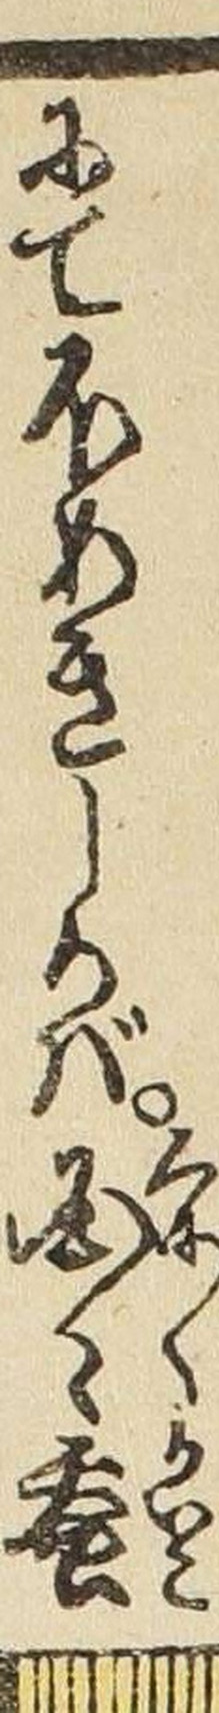にてほめきしかば。国々蚕
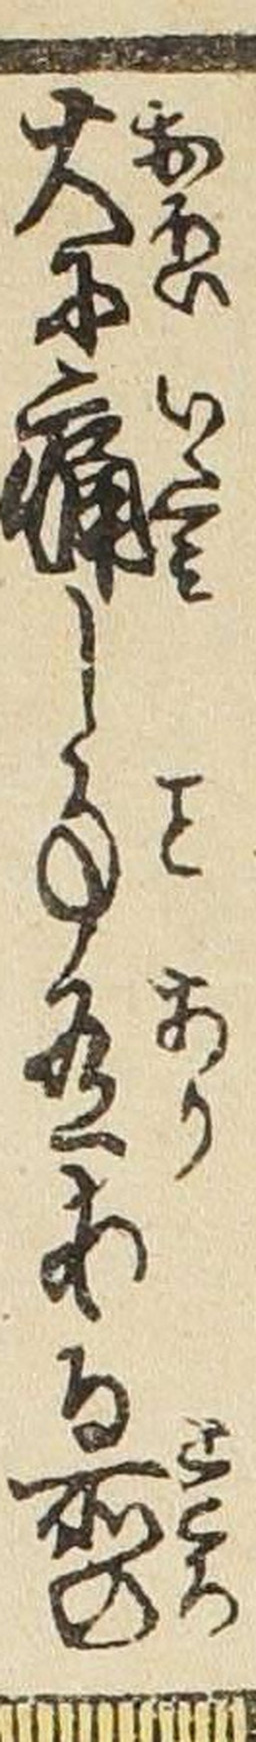大に痛し事有ある所の
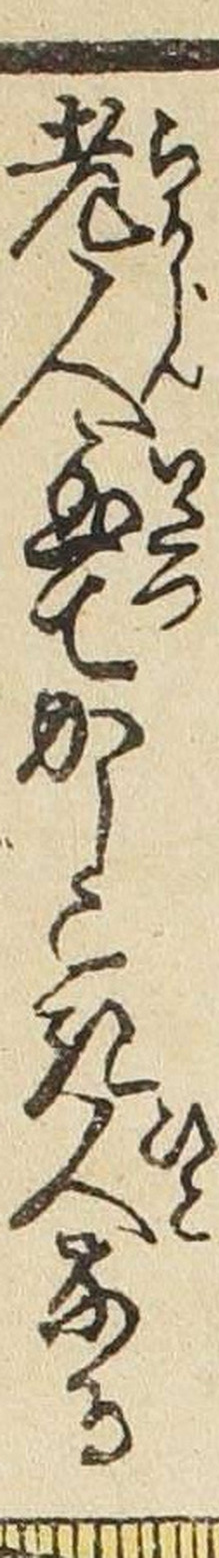老人至てかしこき人なる
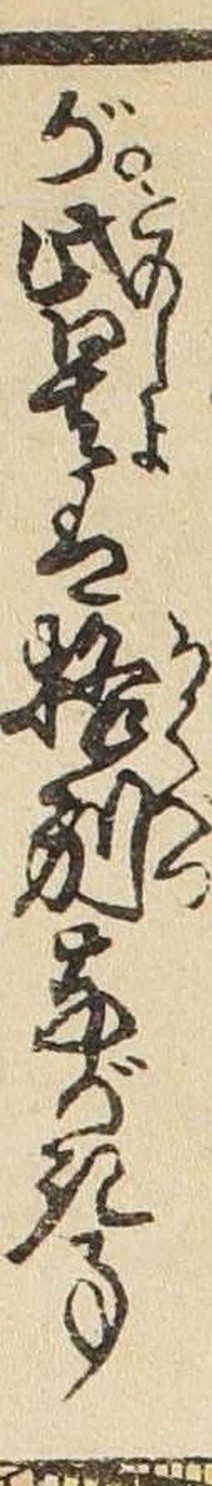が。此暑は格別ながき事
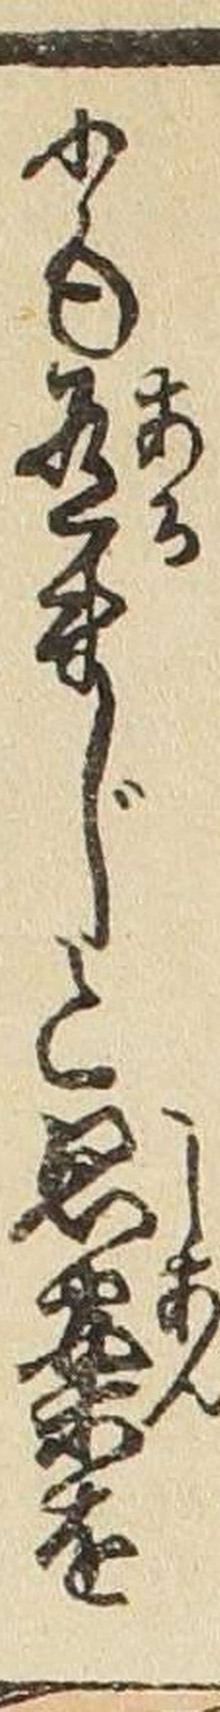にも有まじと思案を
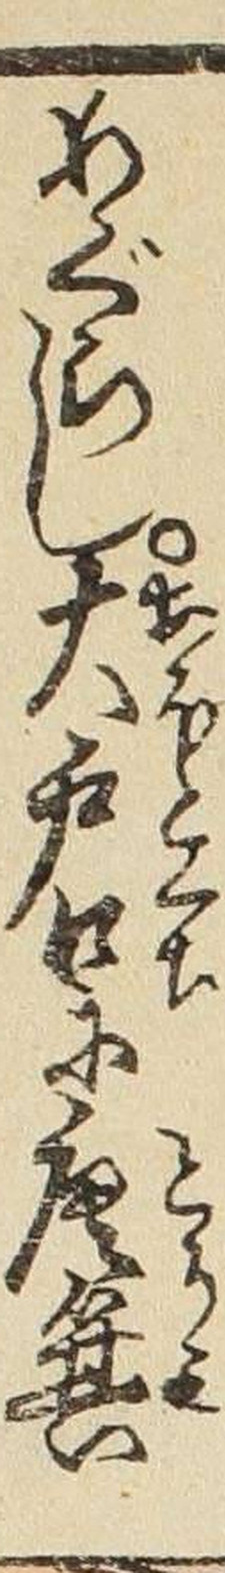めぐらし。大戸口に唐箕
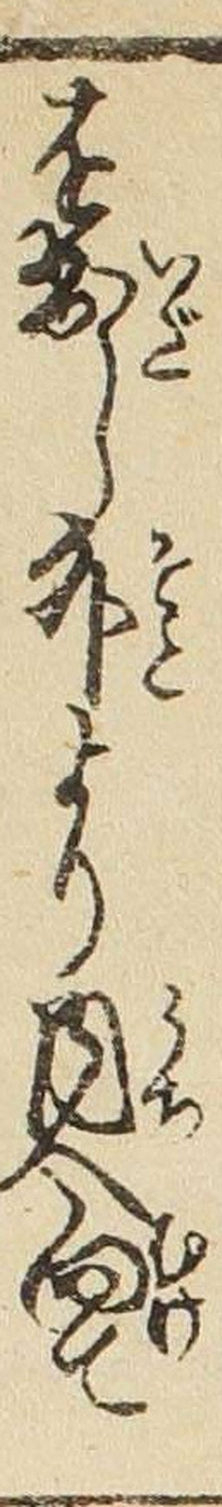を出し外より内へ向て
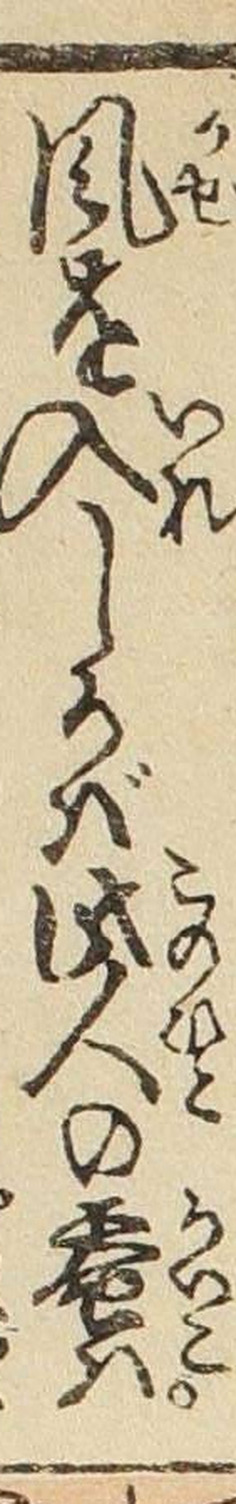風を入しかば此人の蚕は。
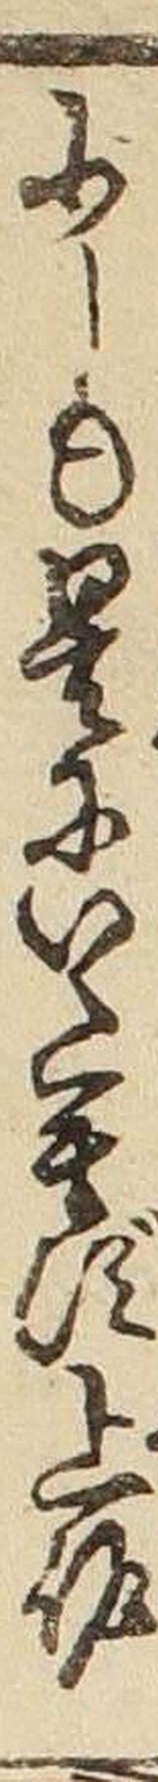少しも暑にいたまず上作
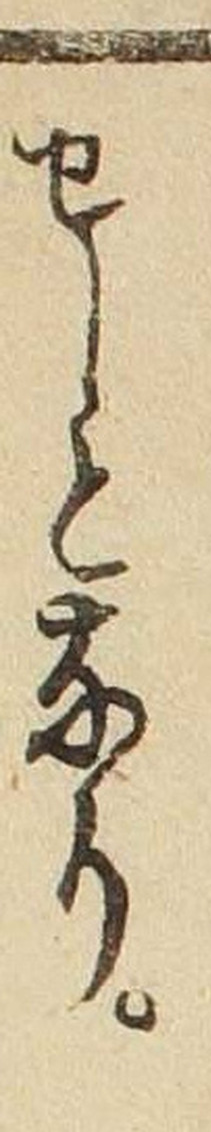せしとなり。

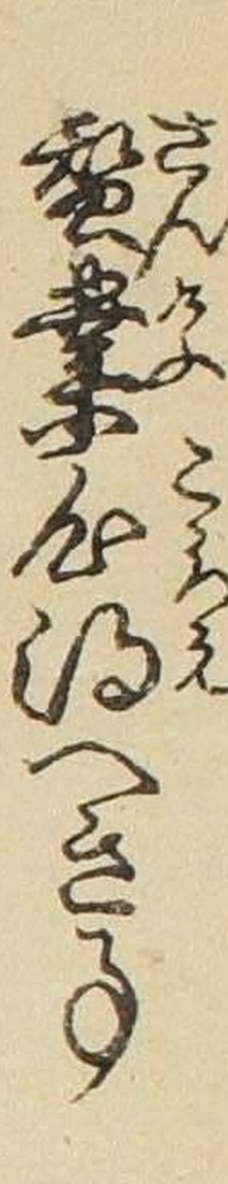蚕業心得へき事
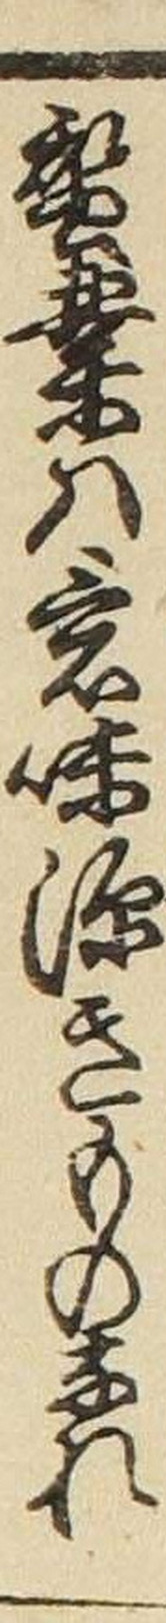蚕業は意味深きものなれ
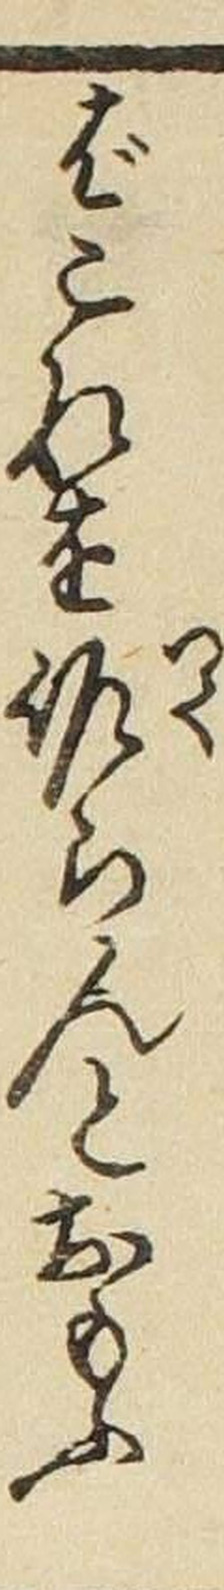ばこれを作らんとおもふ
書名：養蠶圖解
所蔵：東京大学農学生命科学図書館 国文学研究資料館
